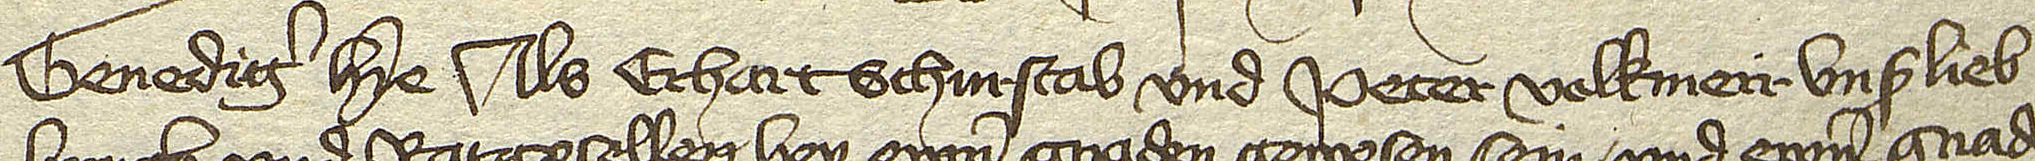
Gnedig* hr* e Als Erhart Schurſtab vnd Peter volkmeir vnſ* lieb
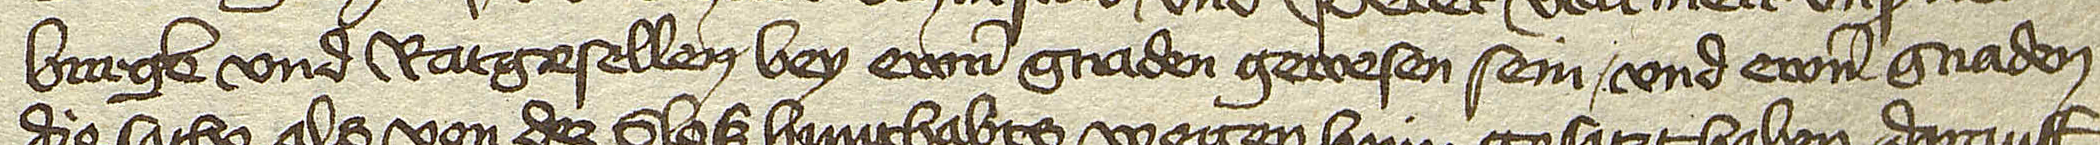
burge* vnd Ratgeſellen bey ewn* gnaden geweſen ſein / vnd ewn* gnaden
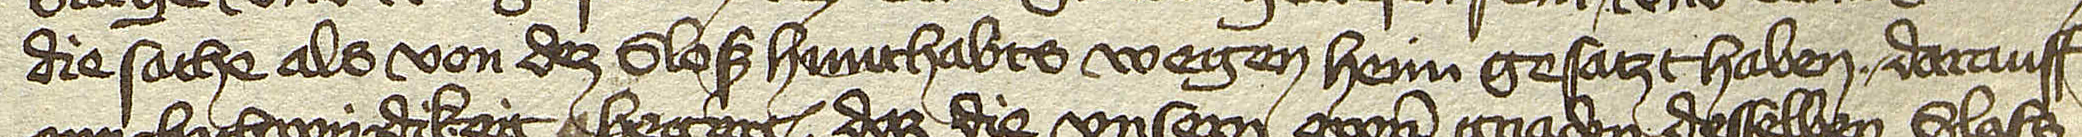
die ſache als von deʒ Sloſʒ hunthabts wegen heim geſacʒt haben . / darauff
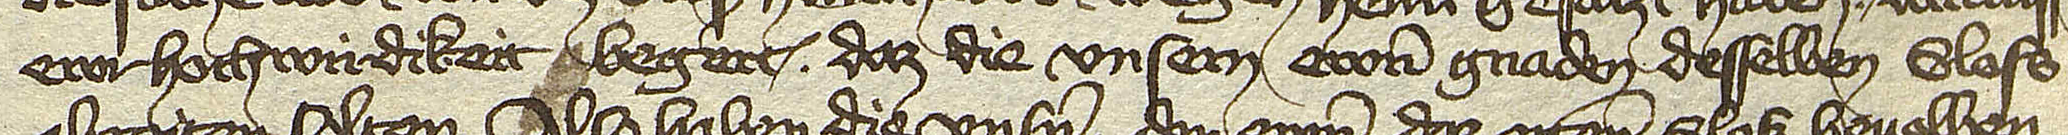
ewr hochwirdikeit begert / . daʒ die vnſern ewn* gnaden deſſelben Sloſs
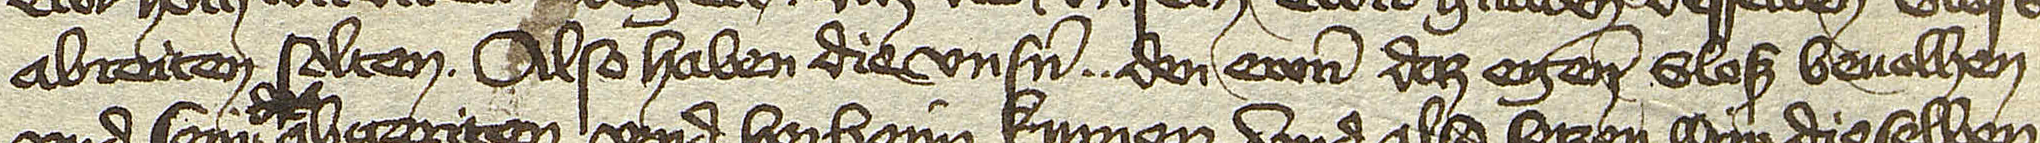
abreiten ſolten . Alſo haben die vnſn* ~ den ewn* daʒ egen* Sloſʒ beuolhen
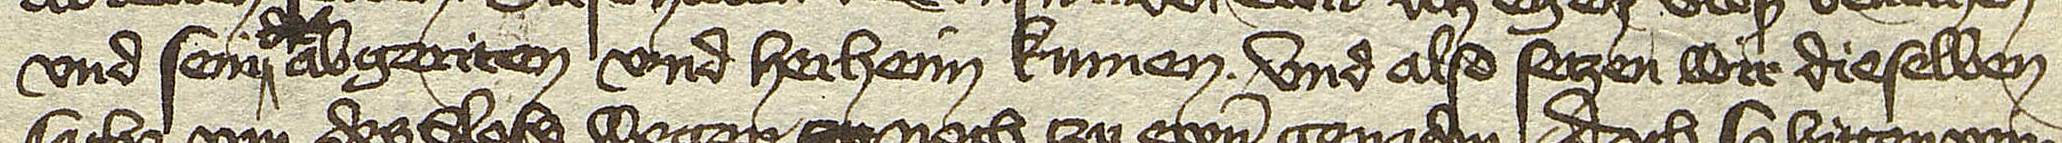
vnd ſein abgeriten vnd herheim kumen . / vnd alſo ſecʒen wir dieſelben
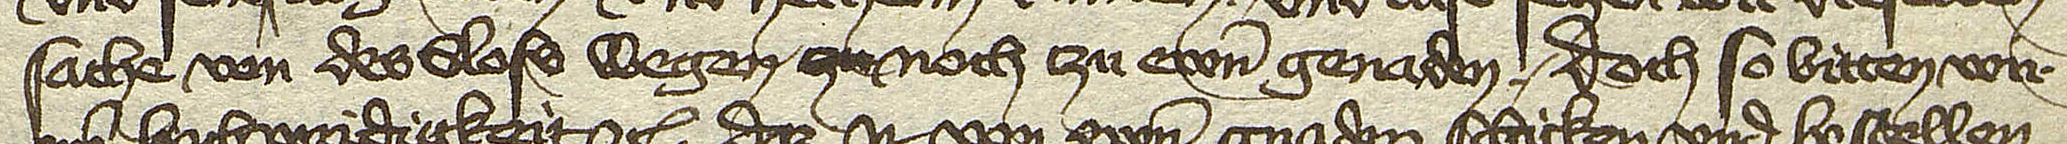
ſache von des Sloſʒ wegen cʒu noch cʒu ewn* genaden . / Doch ſo bitten wir
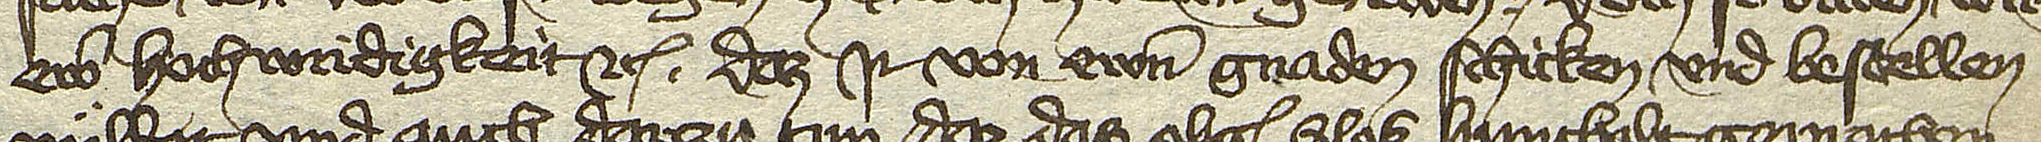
ew* hochwirdigkeit ec* . daʒ Ir von ewn* gnaden ſchicken vnd beſtellen
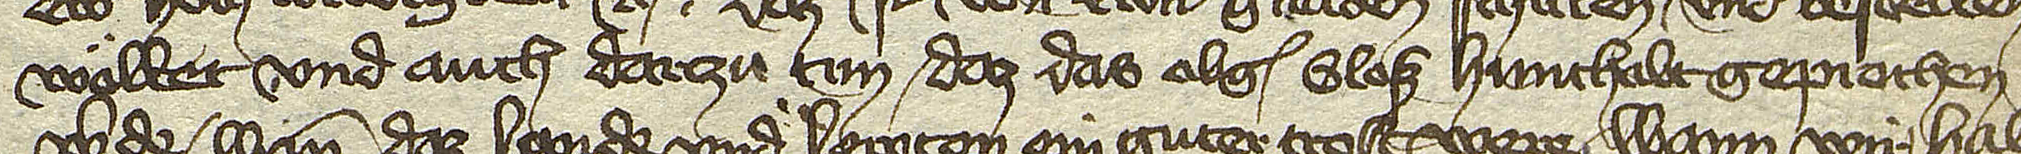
wöllet vnd auch darcʒu tun / daʒ das obg* Sloſʒ hunthabt geprochen
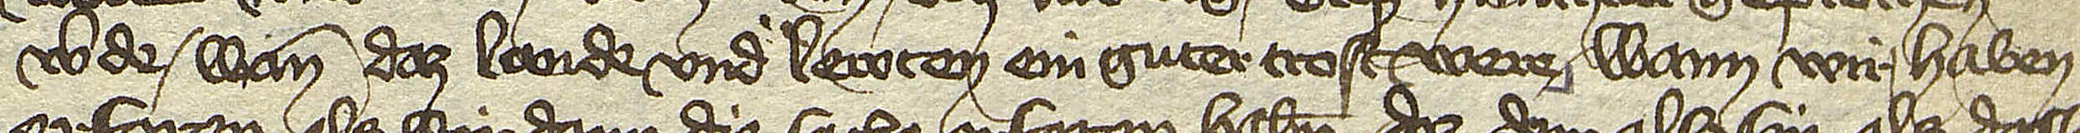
w*de / wan* daʒ lande vnd lewten ein guter troſt were / wann wir haben
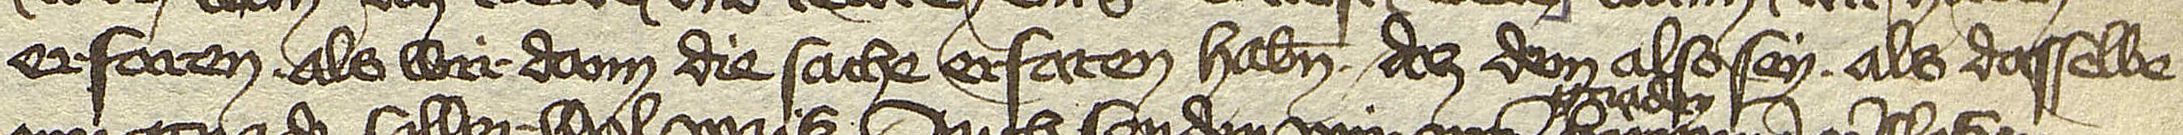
erfaren . als wir dann die ſache erfaren habn* .v/ daʒ dem alſo ſein . als daſſelbe
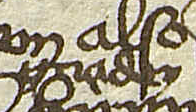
gnaden
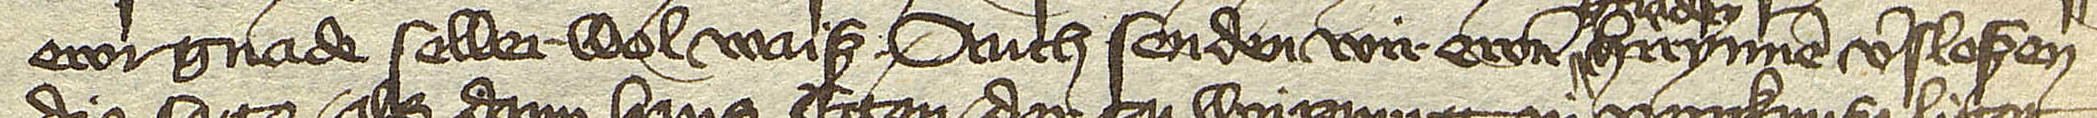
ewr gnade ſelber wol waiſʒ . / Auch ſenden wir ewn* hirynne* v*ſloſʒen
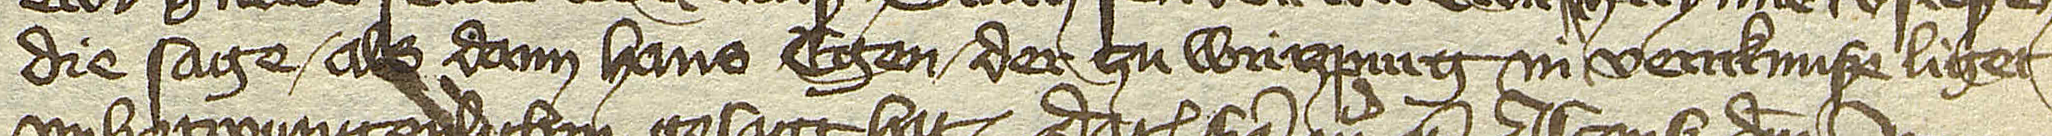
die ſage / als dann hans Egen / der cʒu wircʒburg in venknuſʒe liget
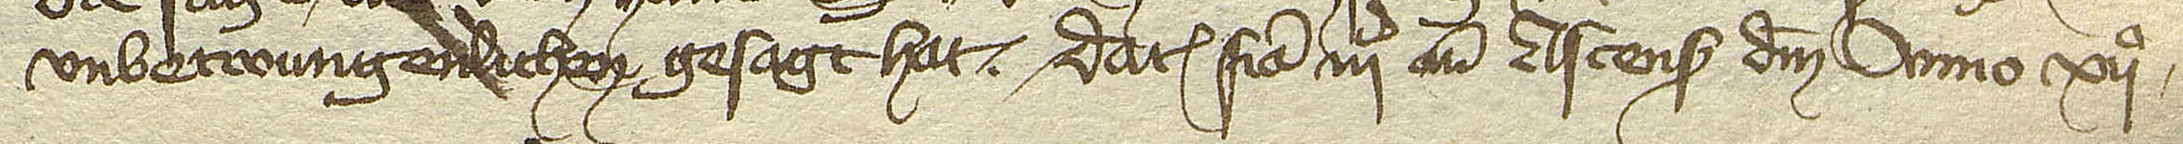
vnbetwungenlichen geſagt hat / . Dat* fia* iii* an* Aſcenſ* dm* Anno xii* /
